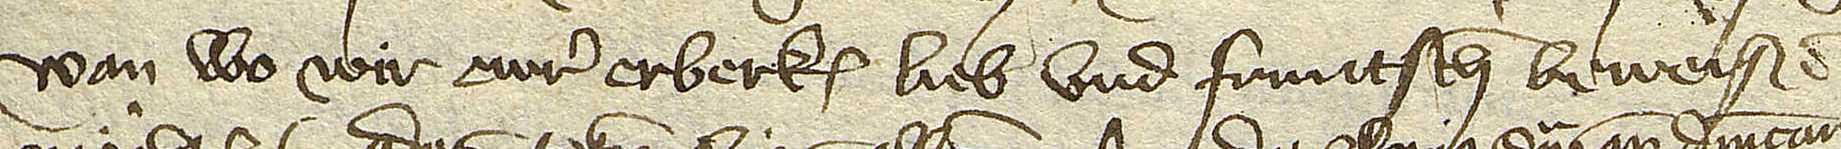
wan wo wir ewr* erberk* lieb vnd freuntſch* beweiſe*
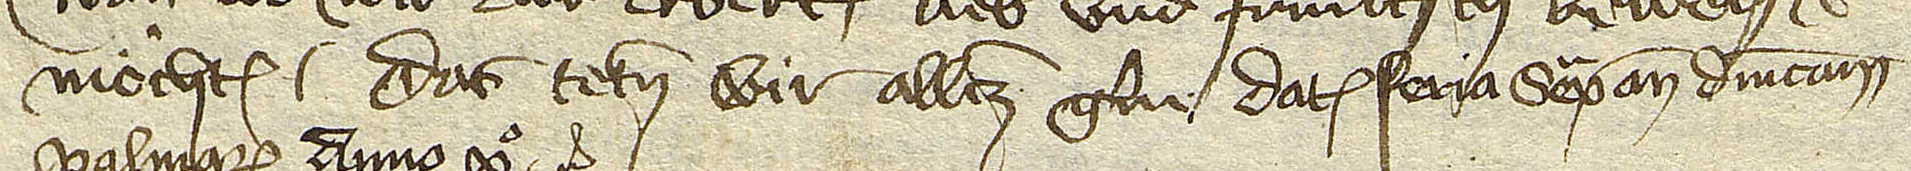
möcht* / Das tetn* wir allcʒ* g*ne / dat* feria Sex* an* dmcam*
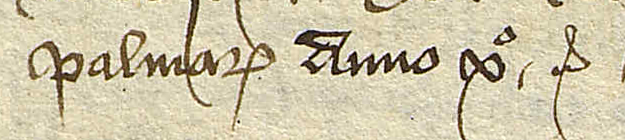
palma* Anno x* / §
